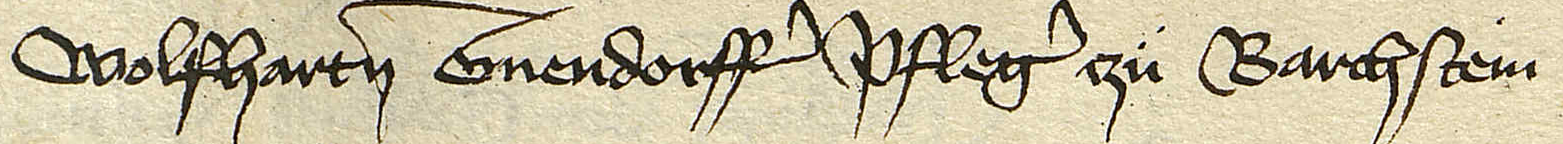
wolfhartn* Gneudorff* Pfleg* cʒü Barchſtein
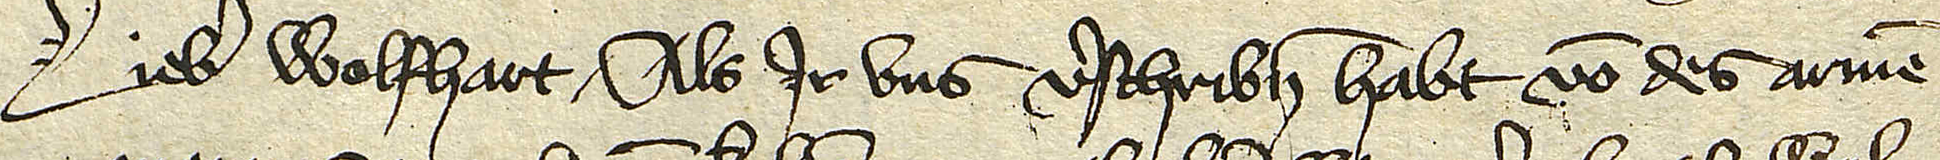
Lieb* Wolfhart / Als Ir vns v*ſchribn* habt vo* des arme*
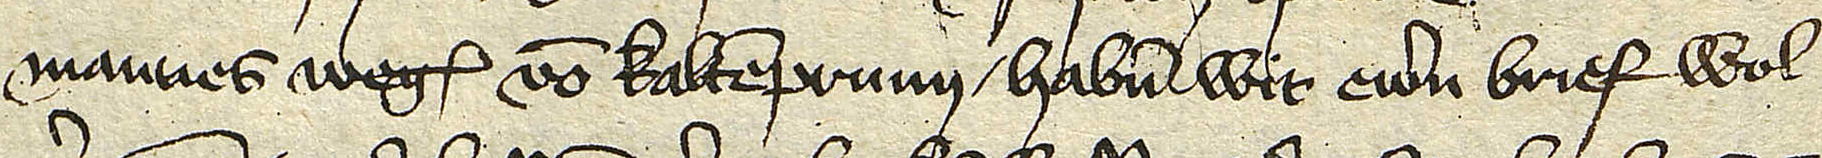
mannes weg* vo* kalte*prunn / habn* wir ew*n brief wol
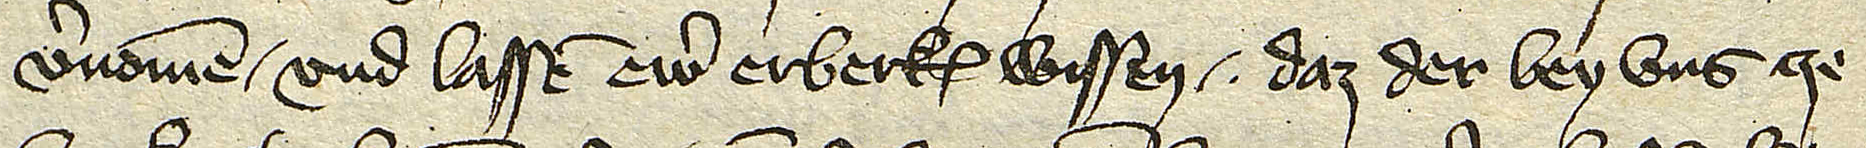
v*nome* / vnd laſſe* ew* erberk* wiſſen / . daʒ der bey vns cʒe
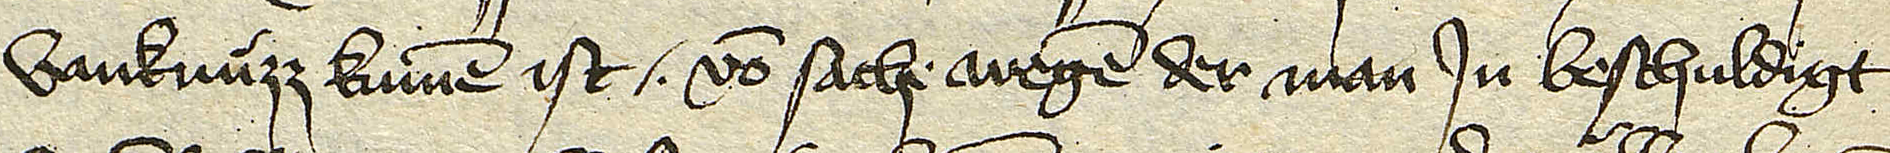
vanknüʒʒ kume* iſt / . vo* ſache wege* der man In beſchuldigt
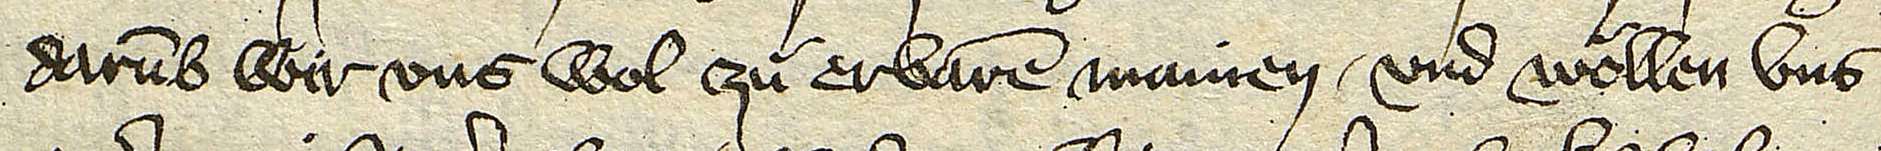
darub* wir vns wol cʒü ervare* mainen / vnd wöllen vns
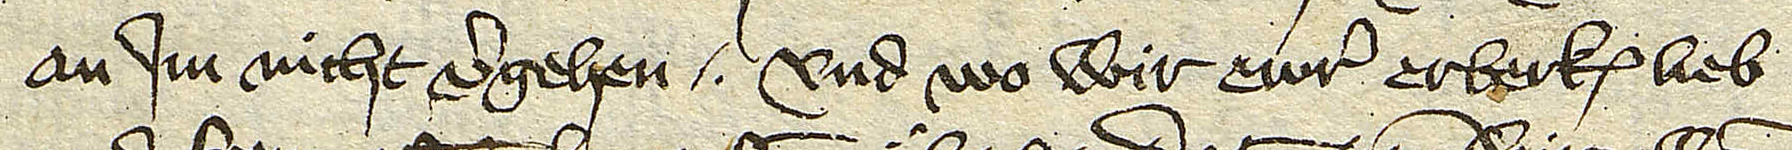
an Im nicht v*gehen / . vnd wo wir ewr* erberk* lieb
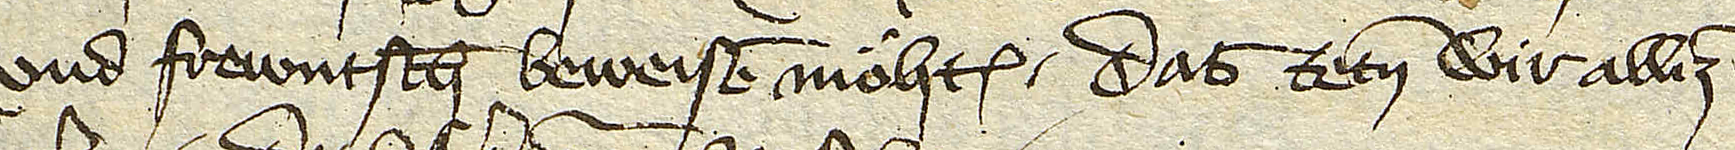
vnd frewntſch* beweiſe* möht* / Das tetn* wir allcʒ*
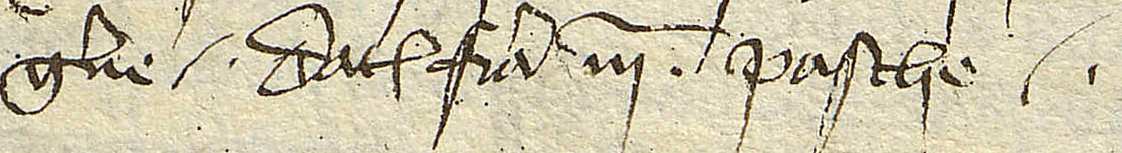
g*ne / . Dat* fia* iii* . Paſche / .
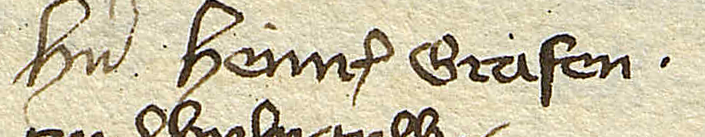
Hn* Heinr* Grafen .
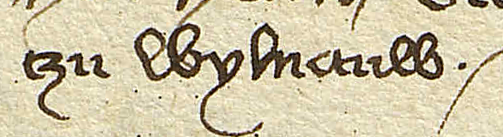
cʒu Wylnauw . /
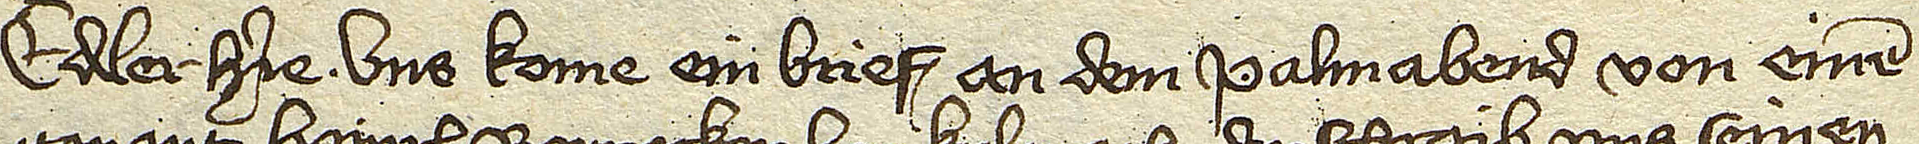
Edler ~ h*re . vns kome ein brief an dem Palmabend von eine*
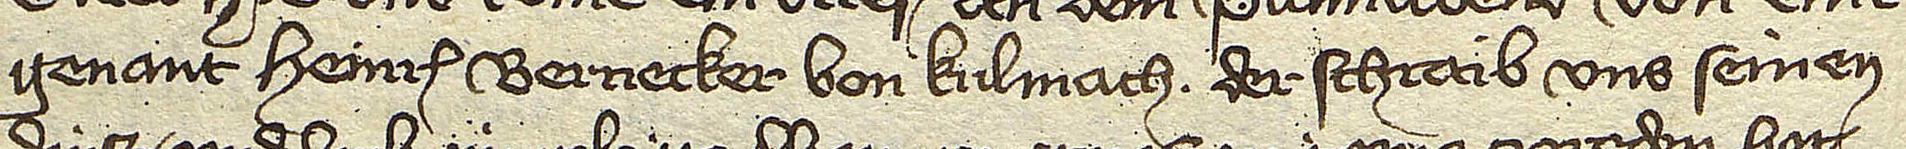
genant Heinr* Bernecker von kulmach . der ſchraib vns ſeinen
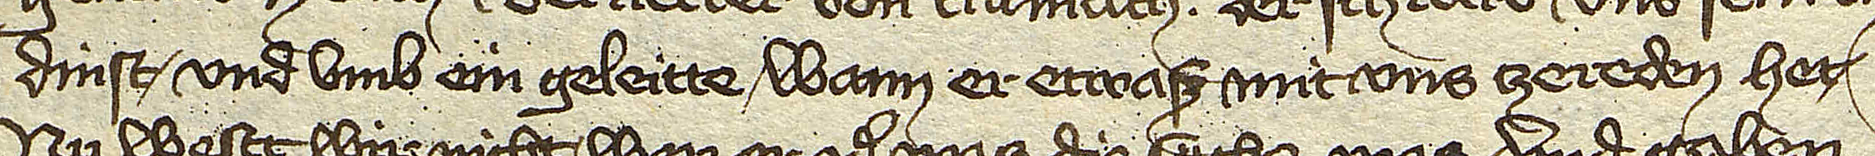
dinſt / vnd vmb ein geleitte / wann er etwaſʒ mit vns cʒereden het /
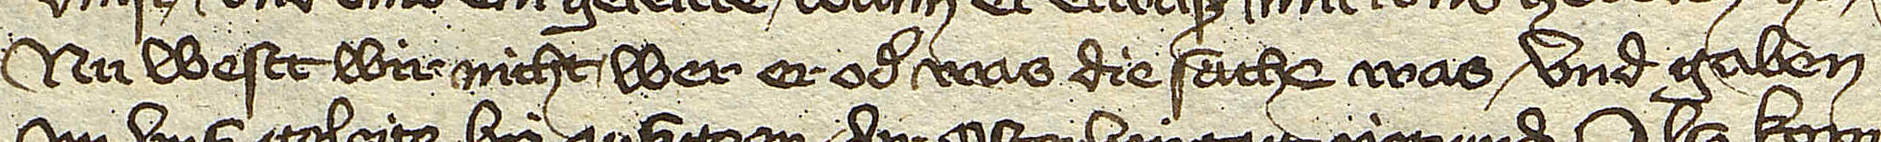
Nu weſtt wir nicht / wer er od* was die ſache was / vnd gaben
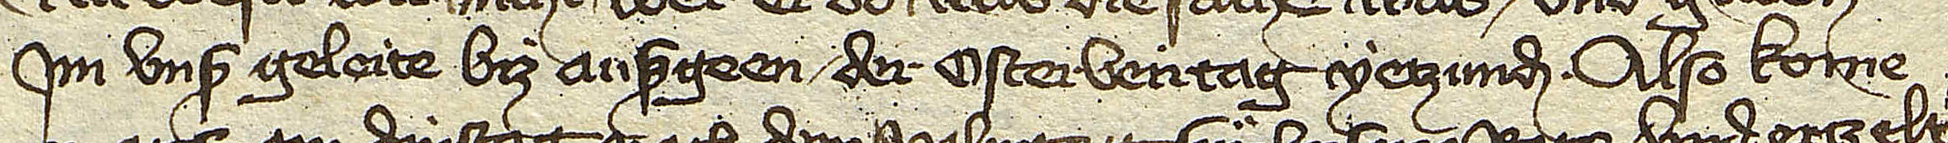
Im vnſ* geleite biʒ auſʒgeen / der Oſterveirtag yecʒund . Alſo kome
